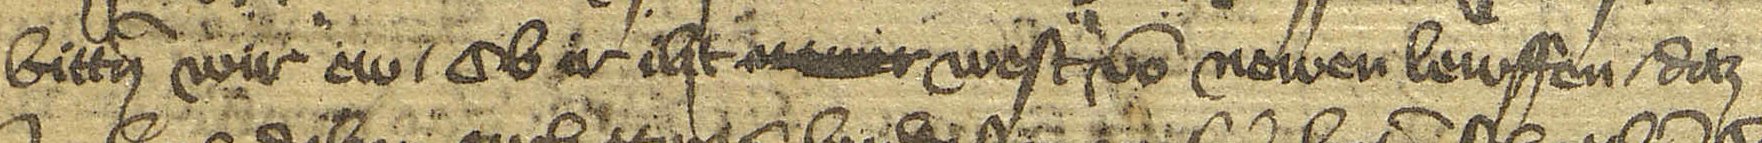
bittn* wir ew / Ob ir iht newer weſt vo* newen lewffen / daʒ
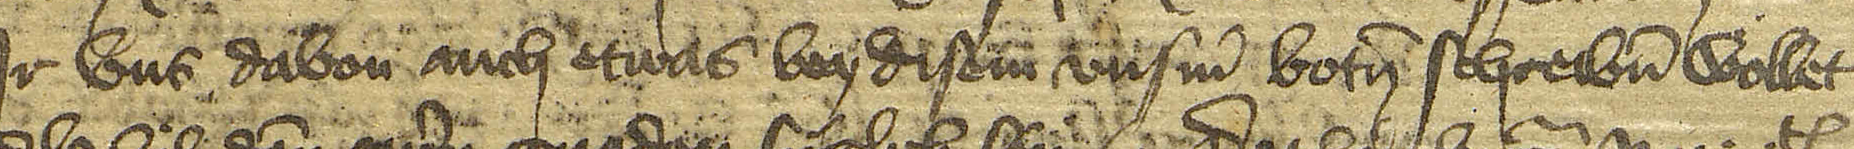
Ir vns davon auch etwas bey diſem vnſm* botn* ſchreibn* wöllet
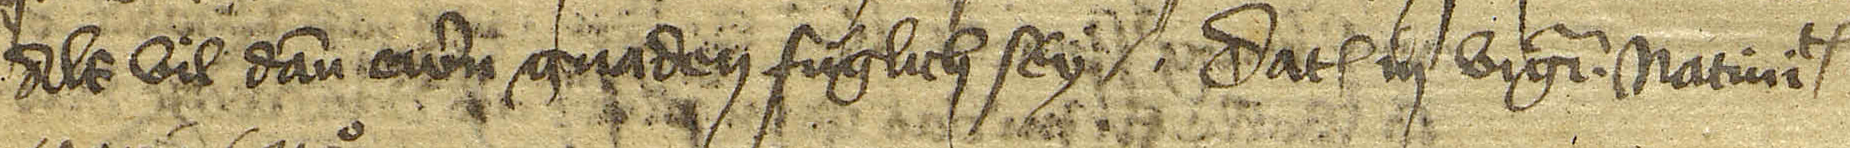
Als vil dan* ew*n gnaden füglich ſey / . Dat* in vigi* . Natiui*
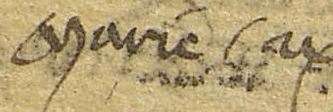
Marie / ix*
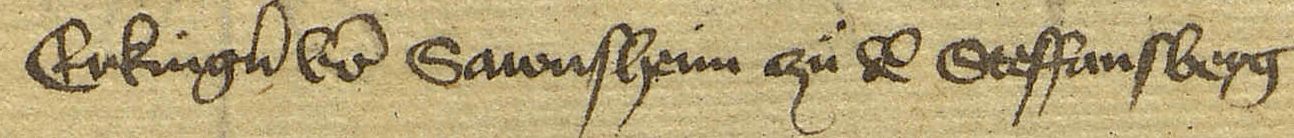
Erkingn* vo* Sawnſheim cʒü d* Steffanſberg
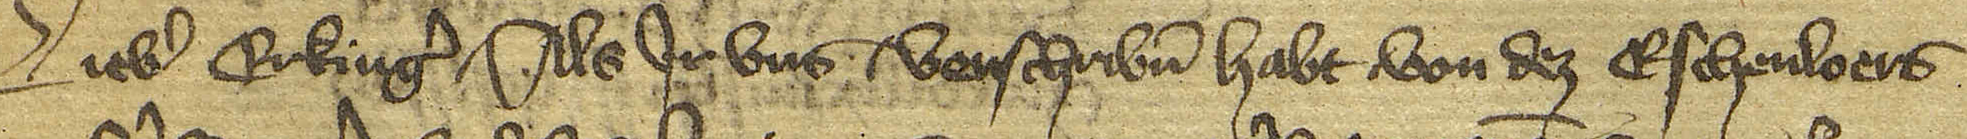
Lieb* Erking* / Als Ir vns / verſchribn* habt / von deʒ Eſchenloers
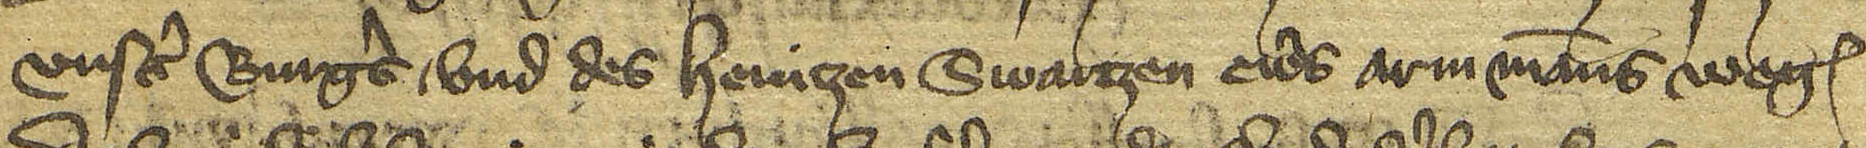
vnſs* Burg*s / vnd des heincʒen Swarcʒen ew*s armman*s weg*
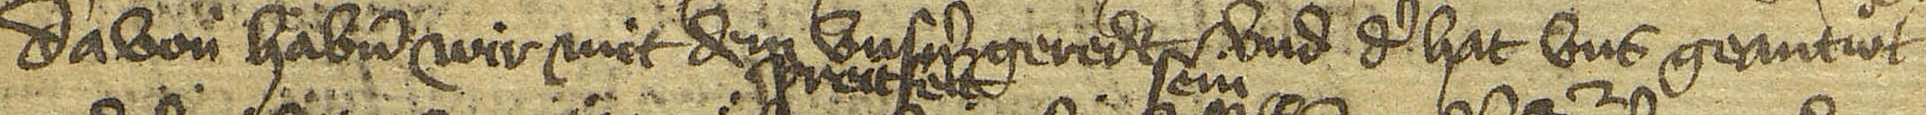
Davon habn* wir mit dem vnſm* geredt / . vnd d* hat vns geantw*t
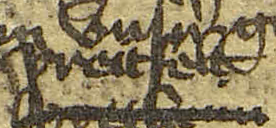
Preitfelt
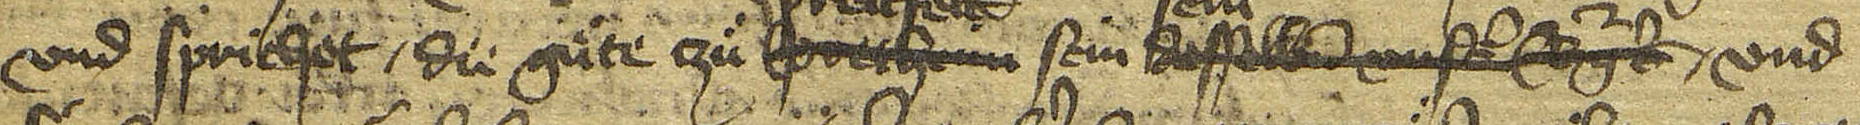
vnd ſprichet / die güte cʒü Pretheim ſein deſſelbn* vnſs* B*g*s / vnd
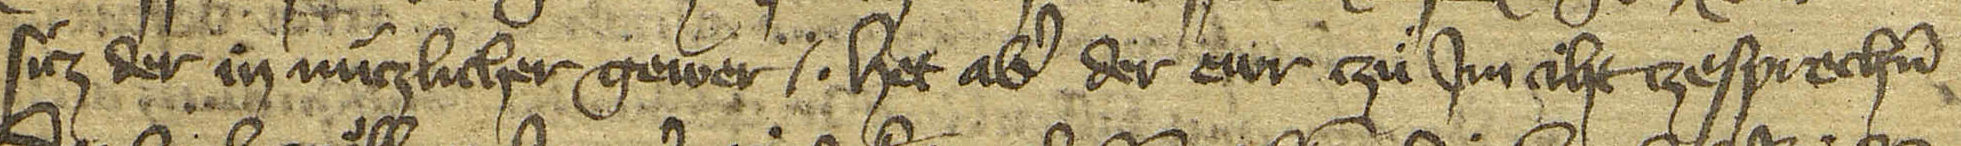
ſicʒ der in nücʒlicher gewer / . het ab* der ewr cʒü Im iht cʒeſprechn*
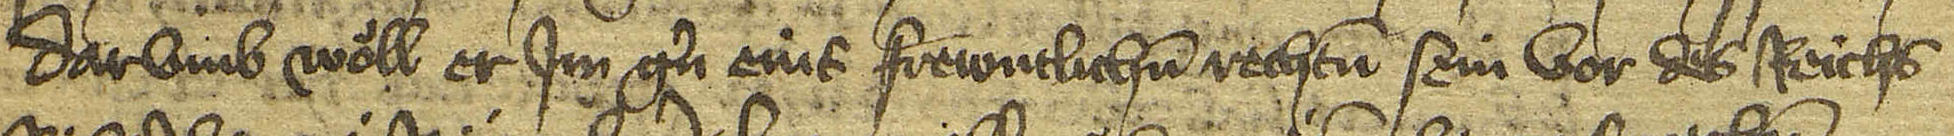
Darvmb wöll er Im g*n eins frewntlichn* rechtn* ſein vor des Reichs
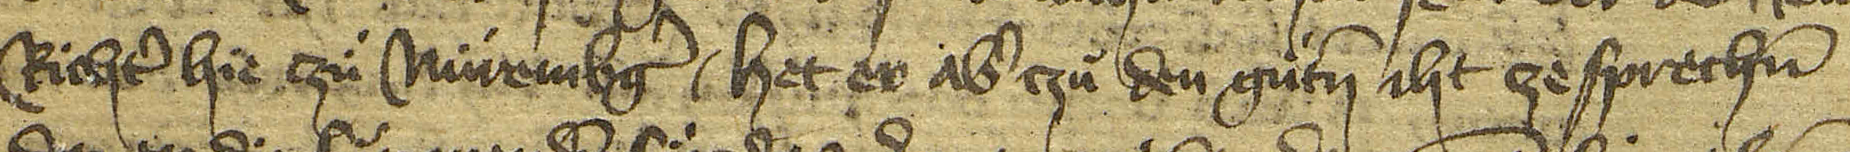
Richt* hie cʒü Nürembg* / het er ab* cʒü den gütn* iht cʒeſprechn*
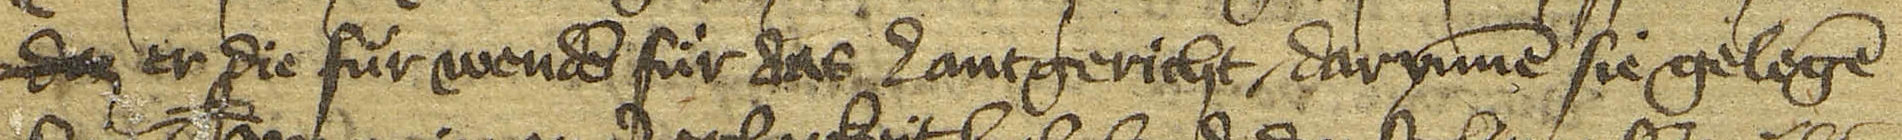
daʒ er die für wende* für das Lantgericht / darynne* ſie gelege*
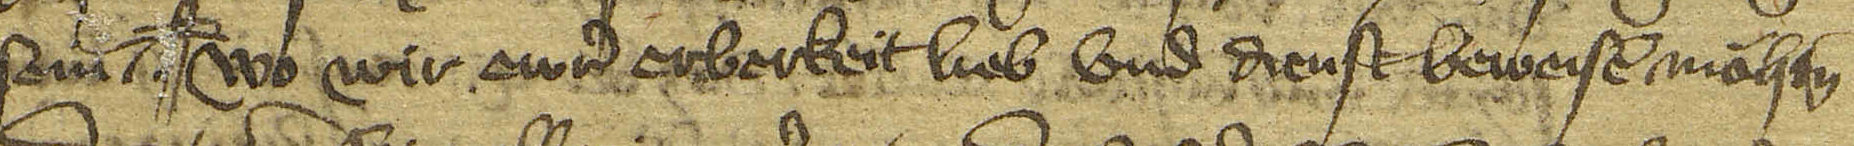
ſein / . Wo wir ewr* erberkeit lieb vnd dienſt beweiſe* möhtn*
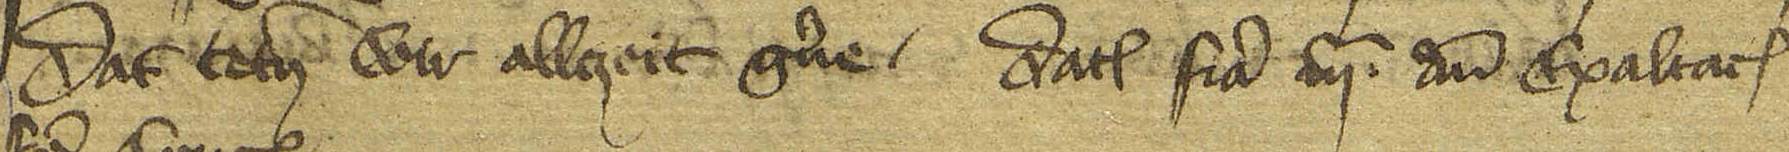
Das tetn* wir allcʒeit g*ne / Dat* fia* iii* . An* Exaltat*
